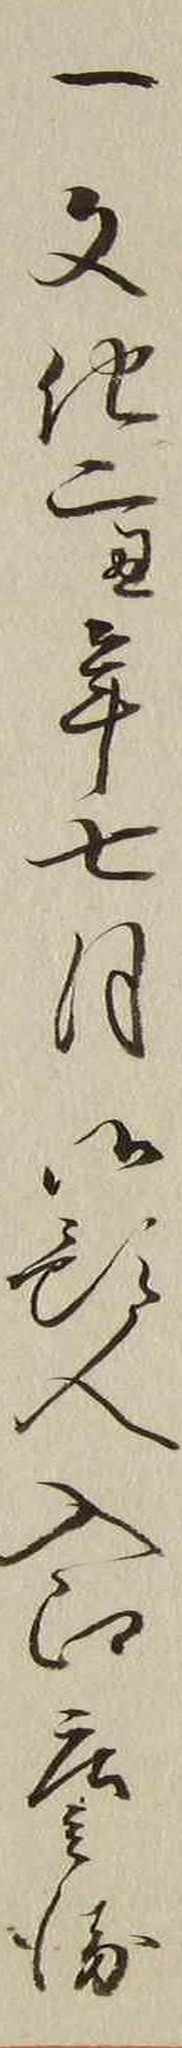一文化二丑年七月御預人入江庄兵衛
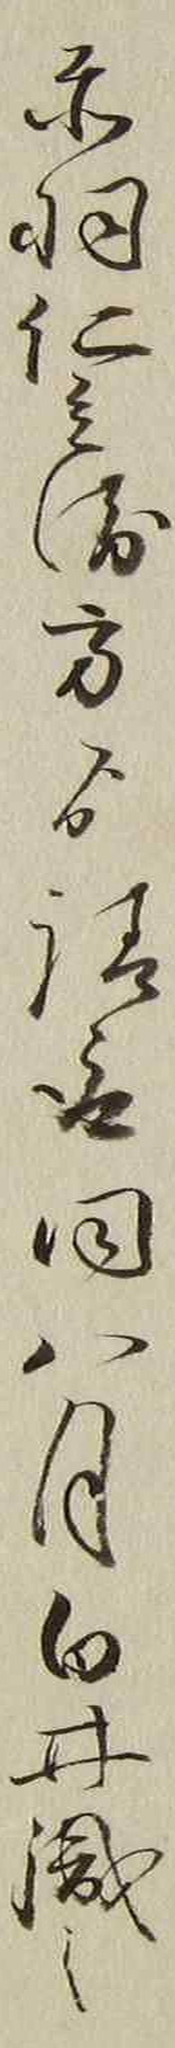赤羽仁兵衛方ゟ請取同八月白井織之
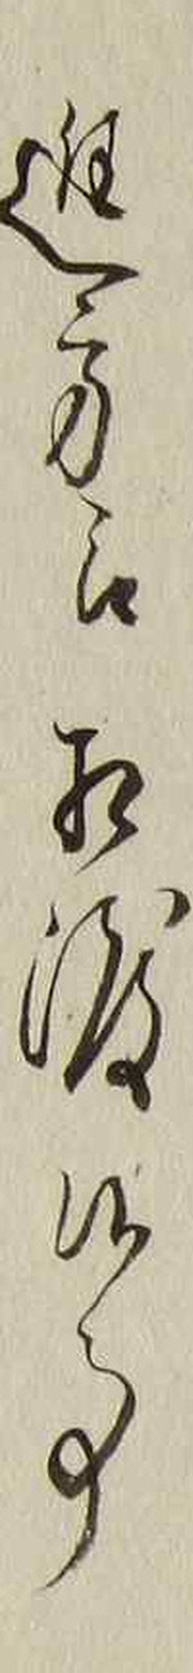進方江相渡候事
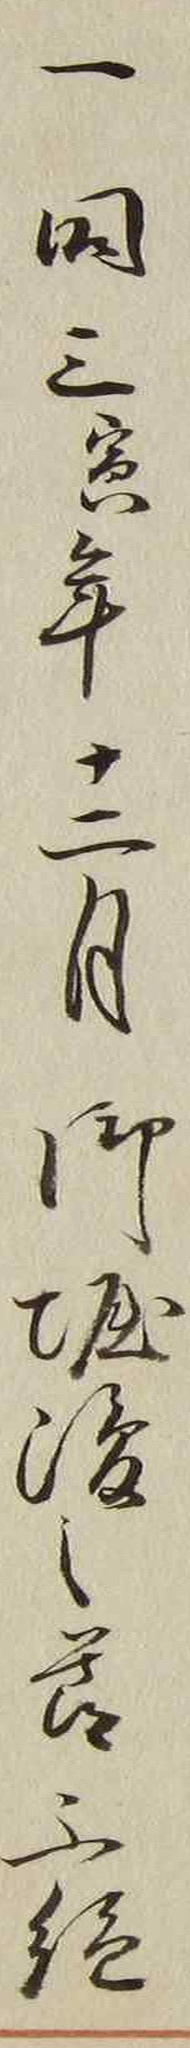一同三寅年十二月御堀浚之節不絶
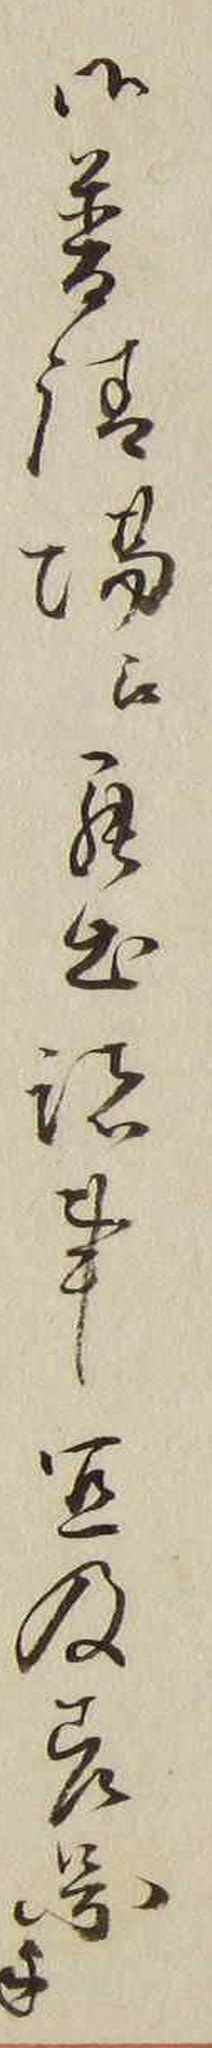御普請場江罷出詰事宜及差図手

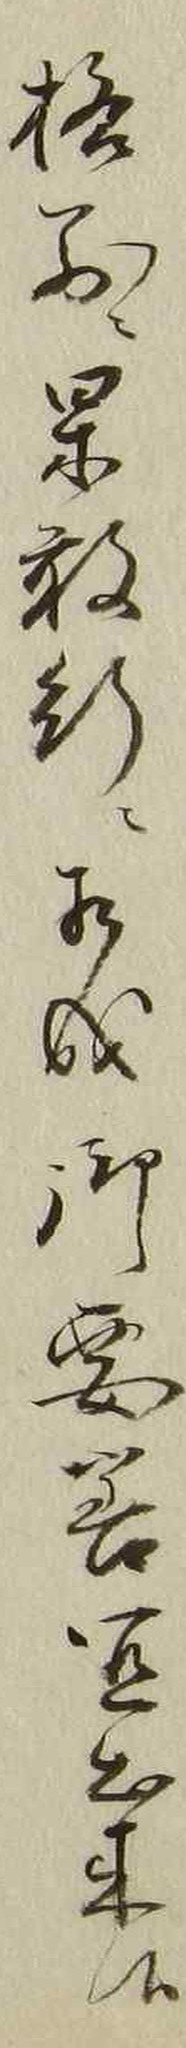格別ニに果敢行ニ相成御要害宜出来候
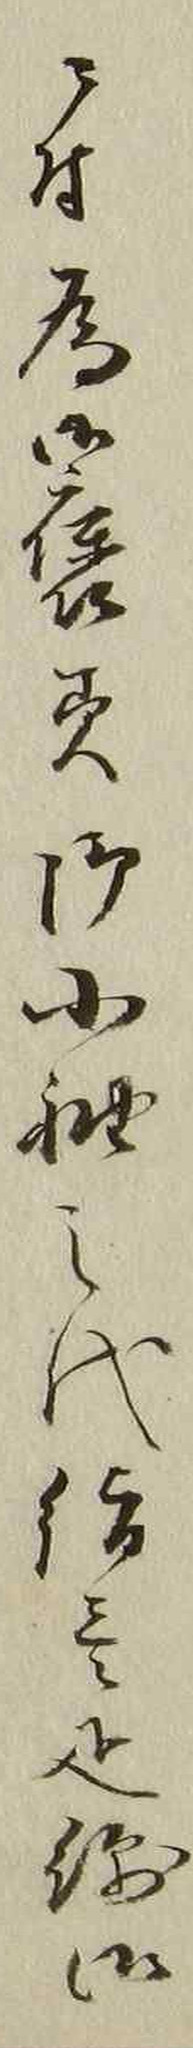ニ付為御褒美御小袖之代絹壱疋綿御
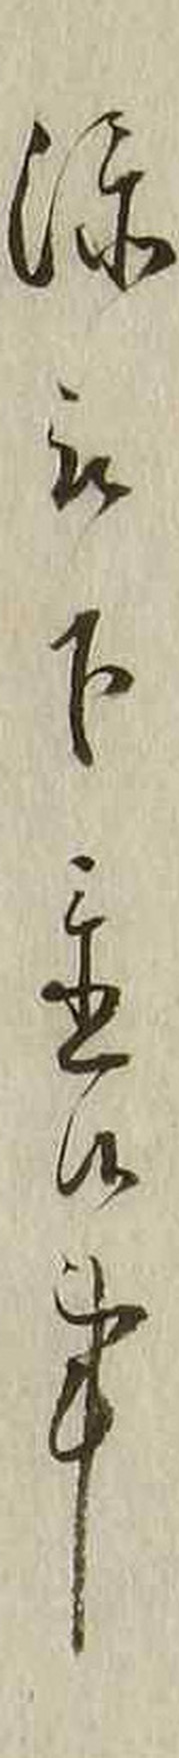添被下置候事
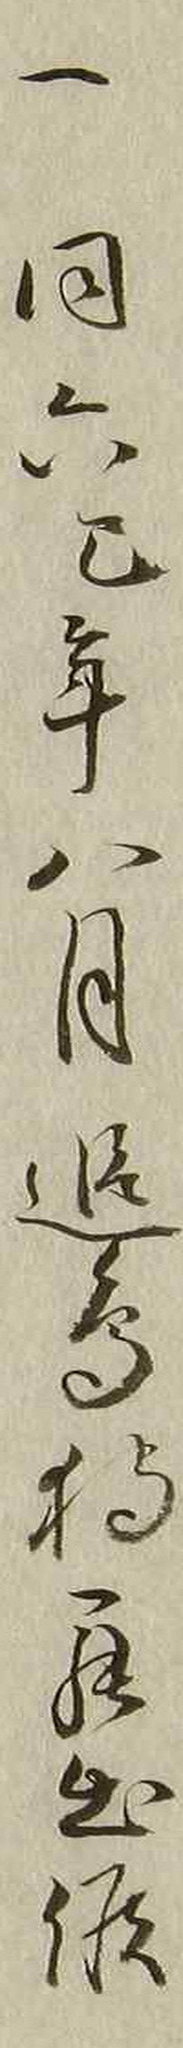一同六巳年八月追鳥狩罷出候
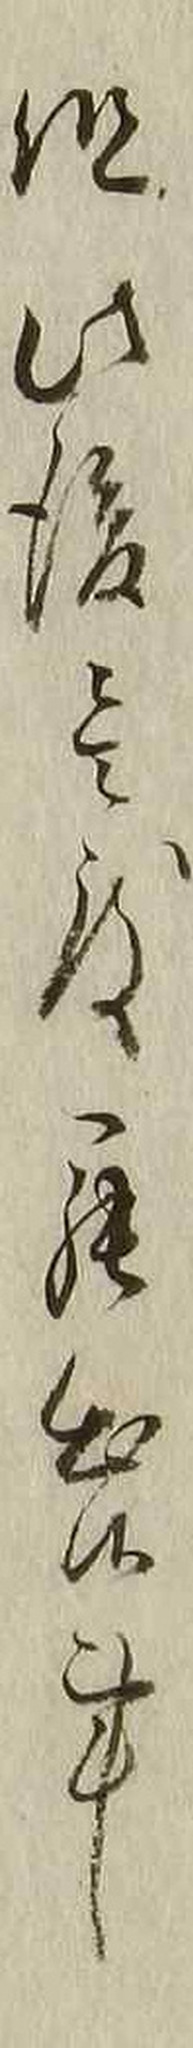但此後壱度罷出候事
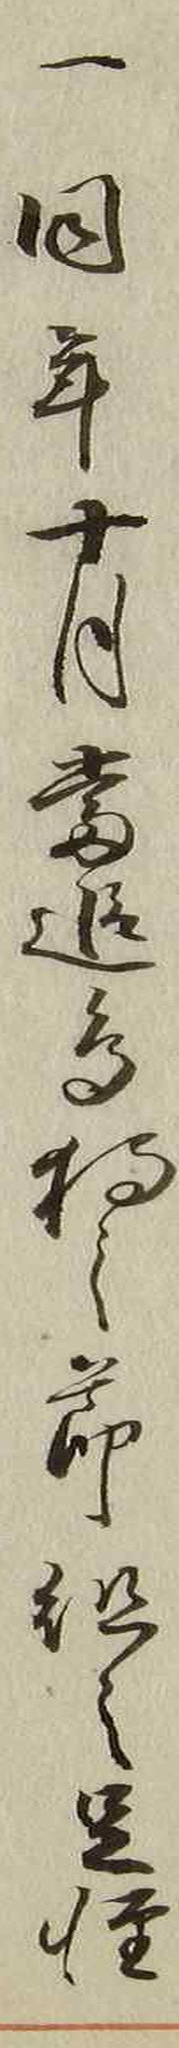一同年十月当追鳥狩之節組之足軽
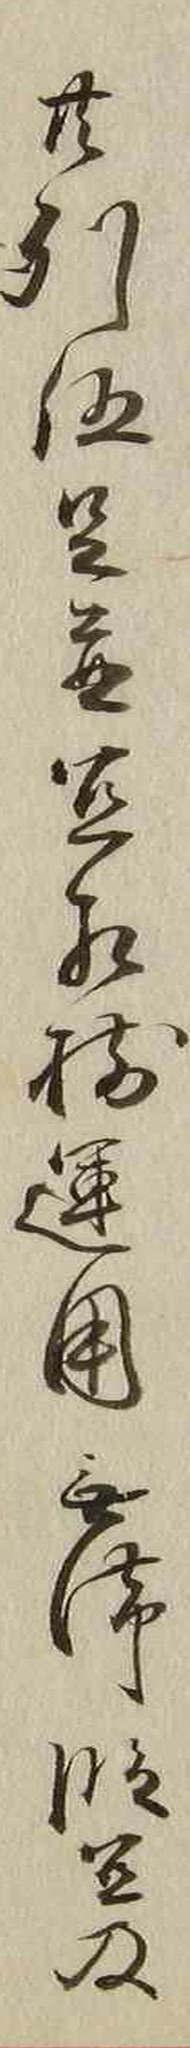共列伍足並宜相揃運用無滞段宜及
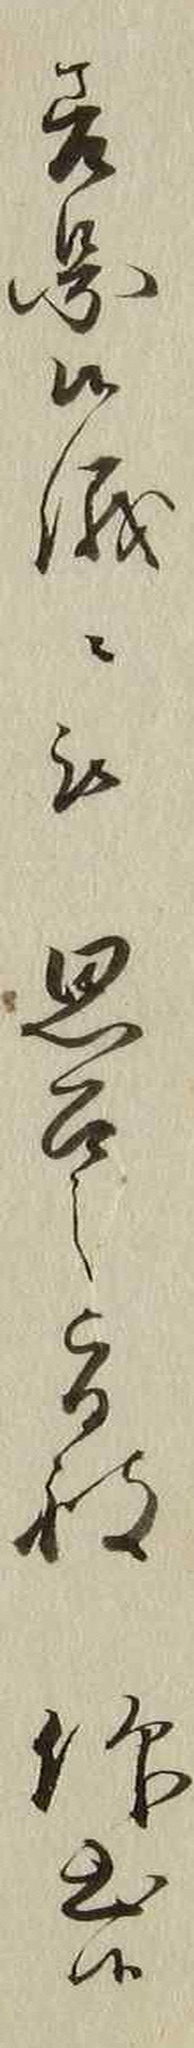差図候儀ニ被思召之旨被仰出候
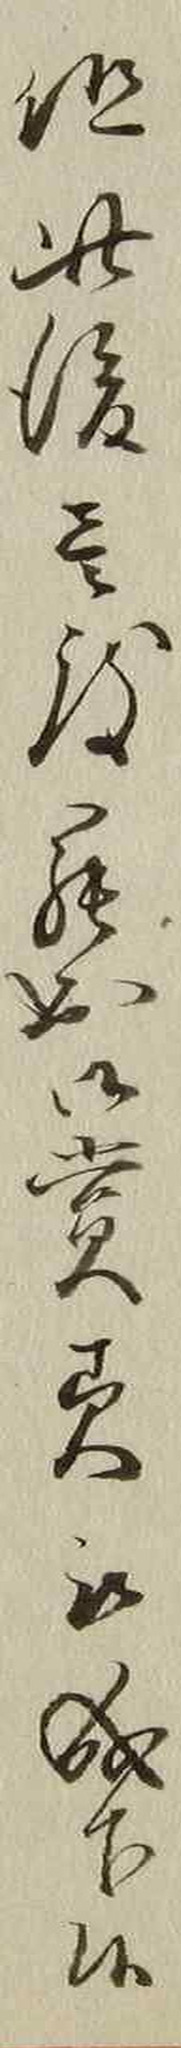但此後壱度罷出御賞美被成下候
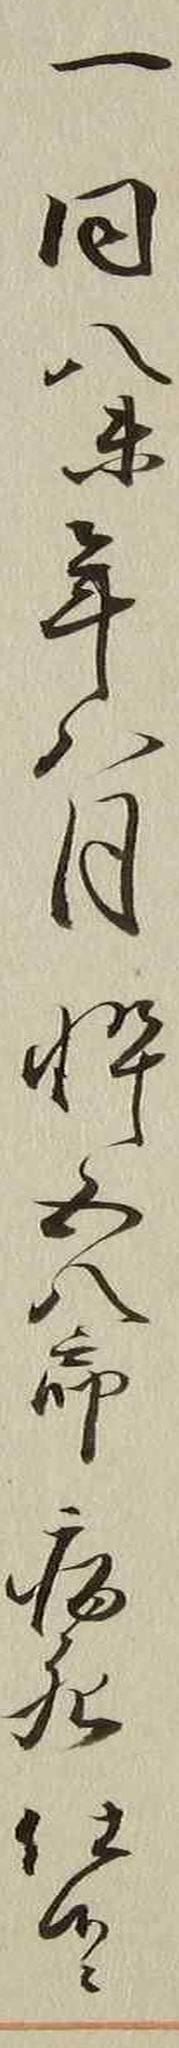一同八未年八月忰五八郎病死仕候ニ
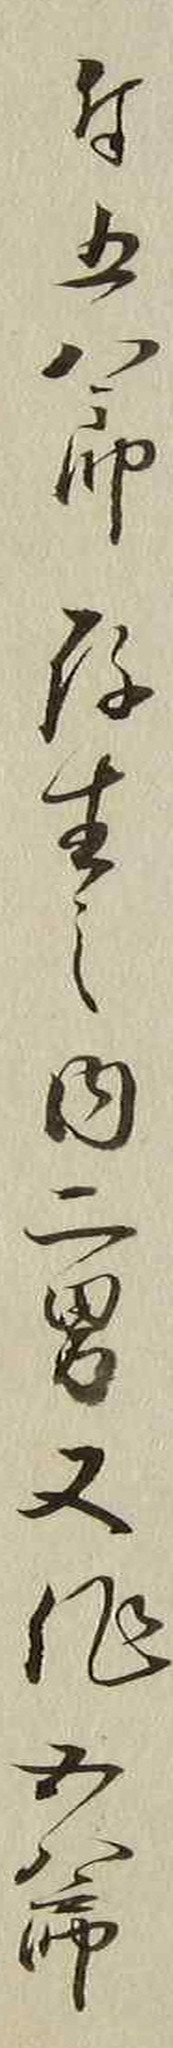付五八郎存生之内二男又作五八郎
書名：諸士系譜　巻之122　よ之部5
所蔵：会津若松市立会津図書館
